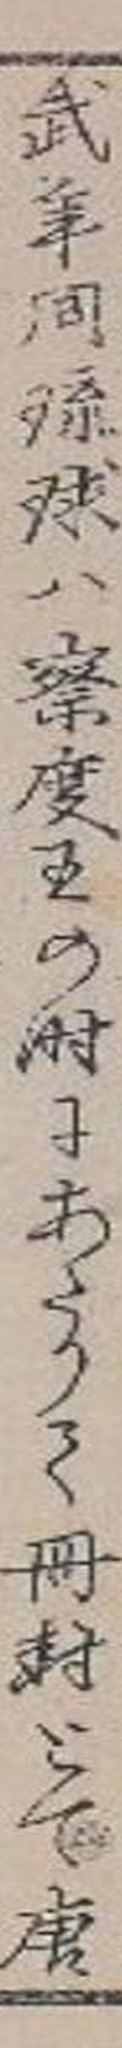武年間、琉球は察度王の時にあたりて冊封とて唐
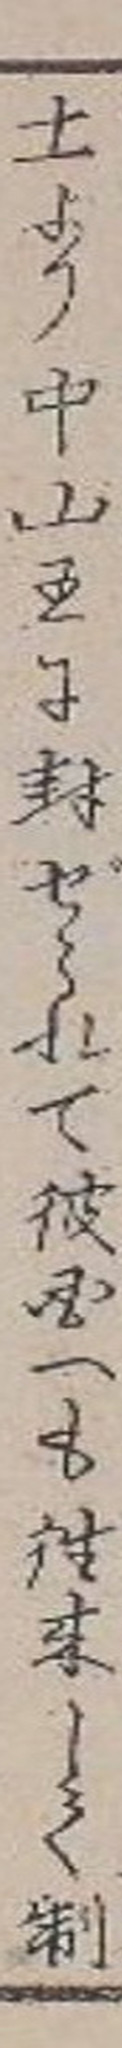土より中山王に封ぜられて、彼国へも往来して、制
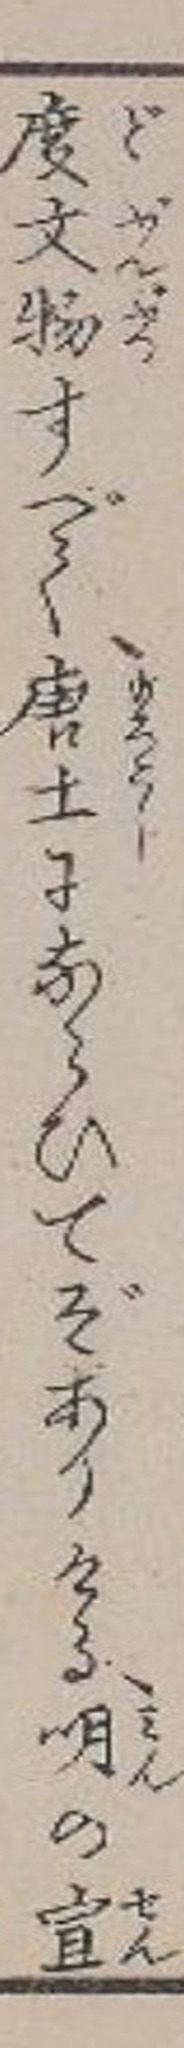度文物すべて、唐土にならひてぞありける、明の宣
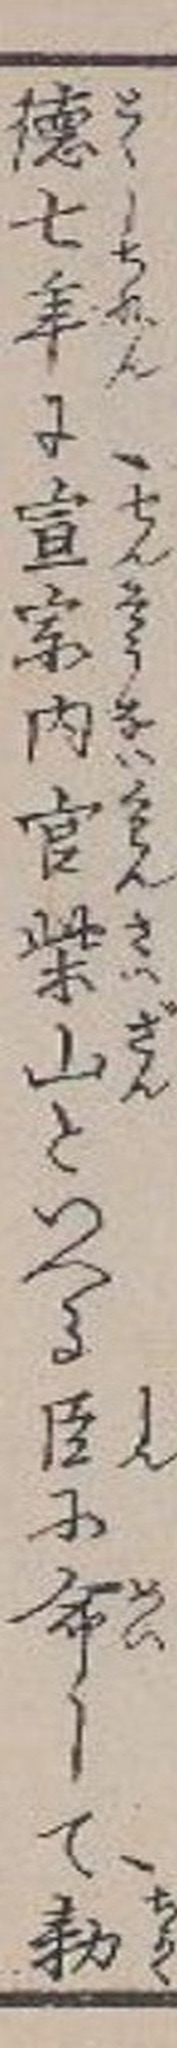徳七年に、宣宗内官紫山といへる臣に命して、勅
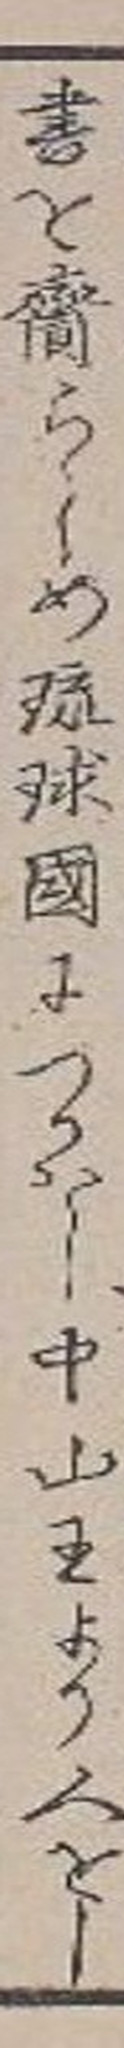書を齎らしめ琉球国につかはし、中山王より人をし
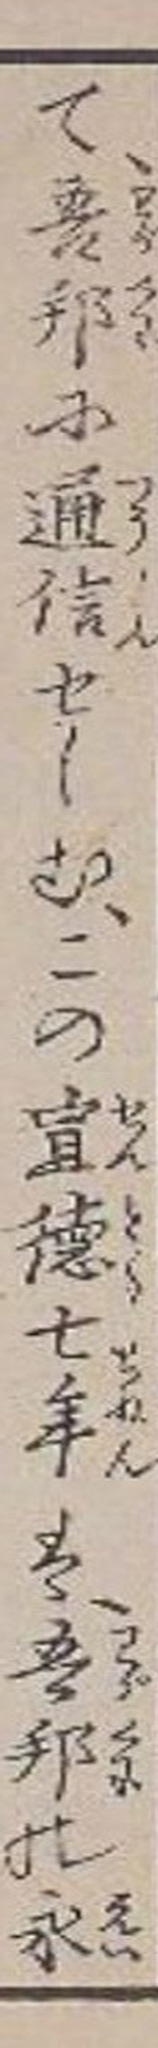て、吾邦に通信せしむ、この宣徳七年は、吾邦の永
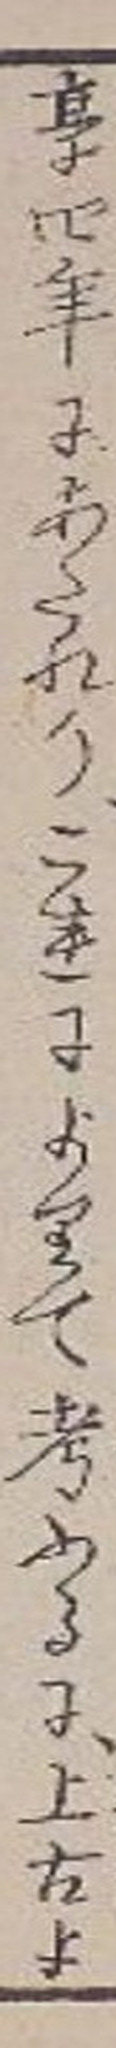享四年にあたれり、これによりて考ふるに、上古よ
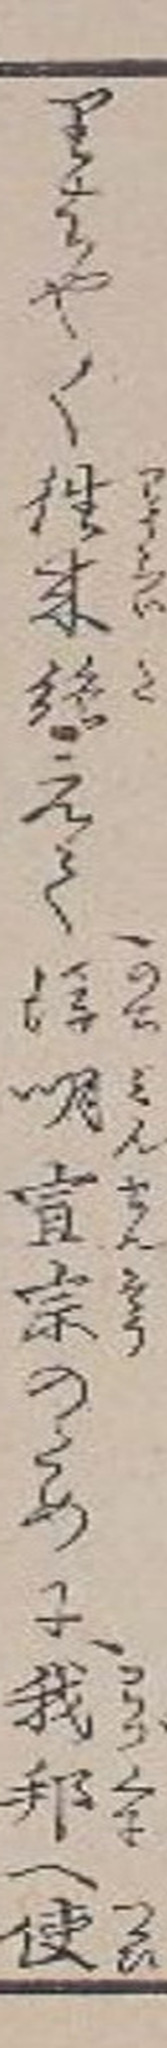りはやく往来絶えて、後明宣宗のために、我邦へ使
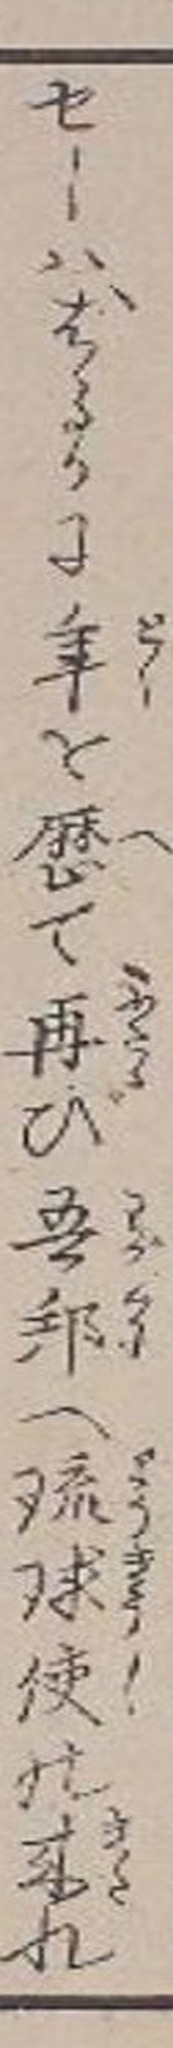せしは、はるかに年を歴て、再び吾邦へ琉球使の来れ
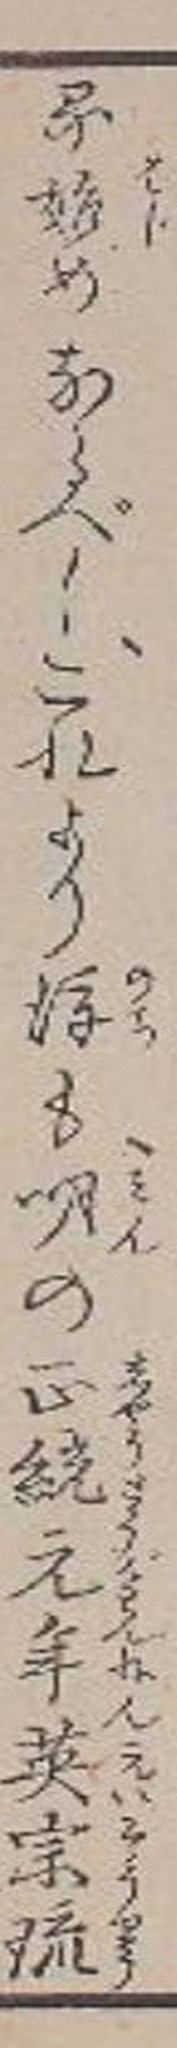る始めなるべし、これより後も、明の正統元年英宗琉
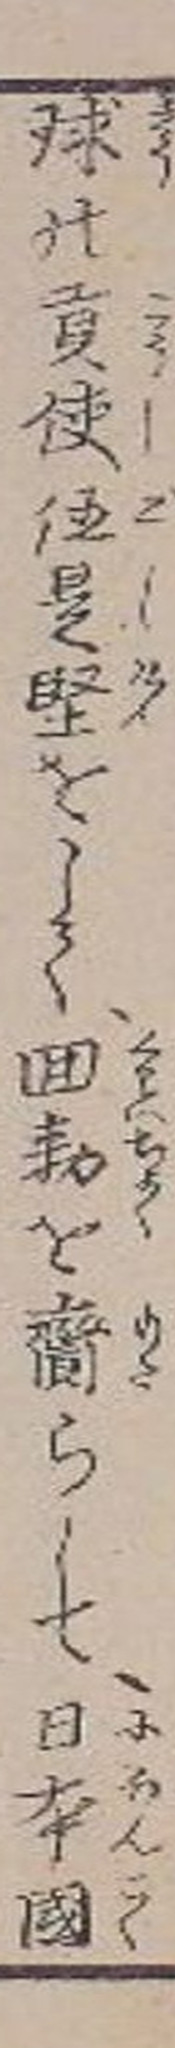球の貢使伍是堅をして、回勅を齎らして、日本国

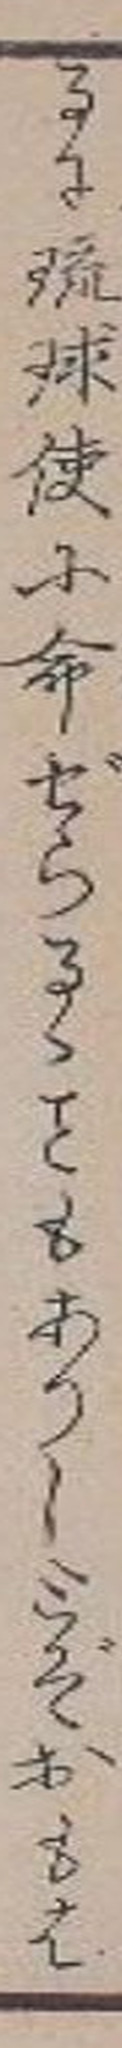るに、琉球使に命ぜらるゝこともありしとぞおもは
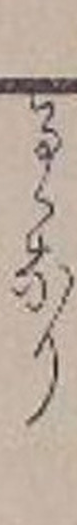るゝなり
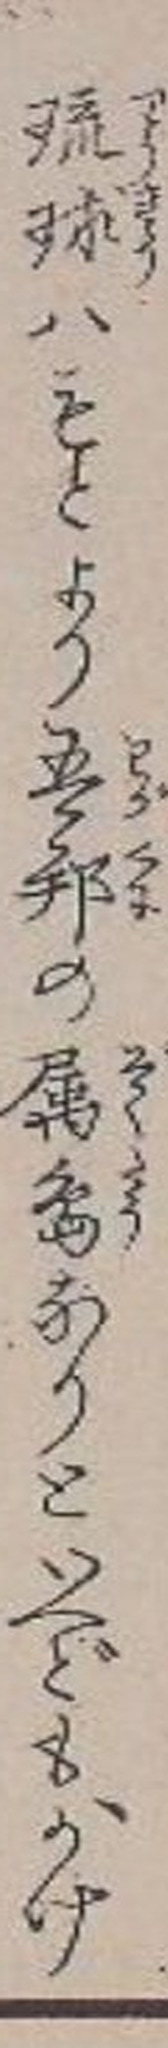琉球はもとより吾邦の属島なりといへども、かけ
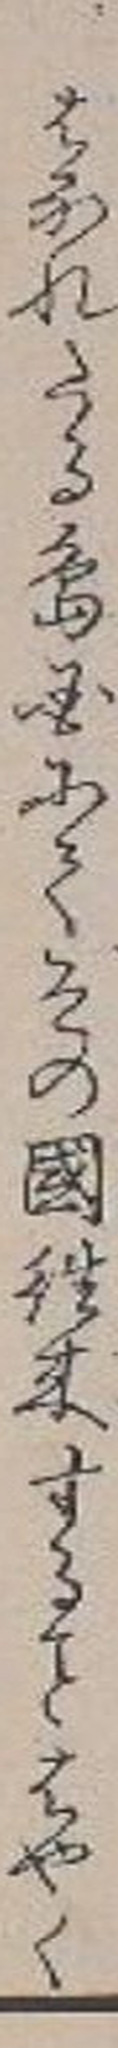はなれたる島国にて、その国往来することはやく
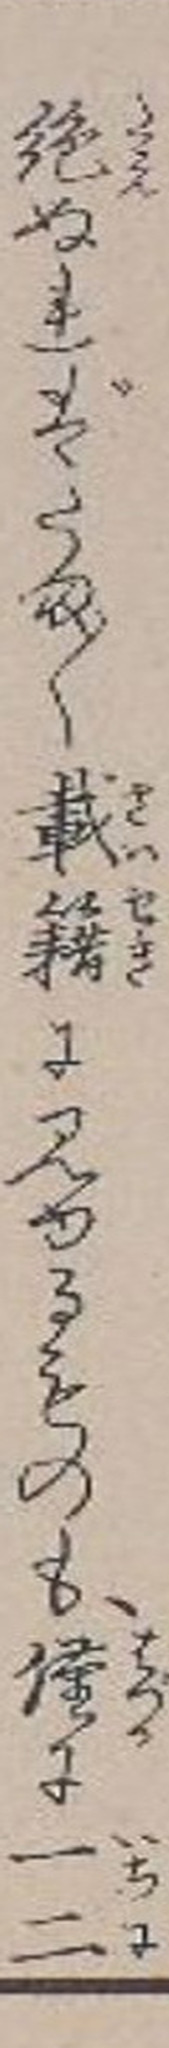絶ぬればたま〳〵載籍に見ゆるものも、僅に一二
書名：琉球入貢紀略
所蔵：University of the Ryukyus Library
